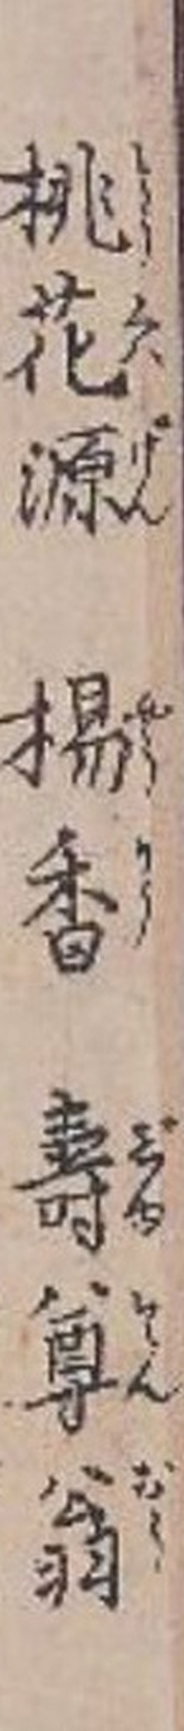桃花源楊香寿尊翁
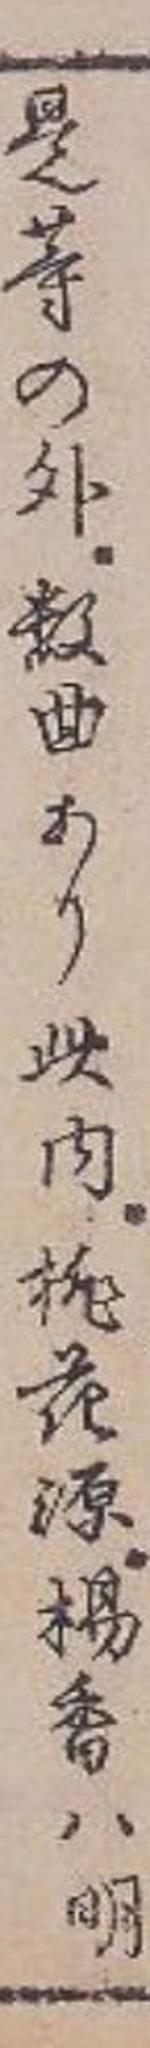是等の外、数曲あり此内、桃花源、楊香は明
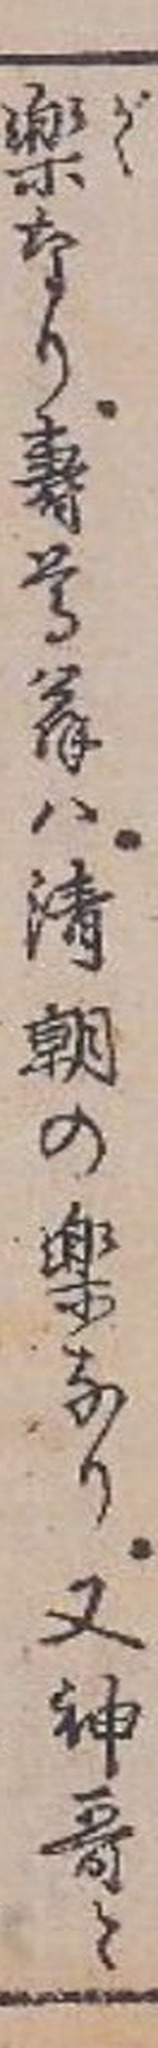楽なり、寿尊翁は、清朝の楽なり、又神歌と
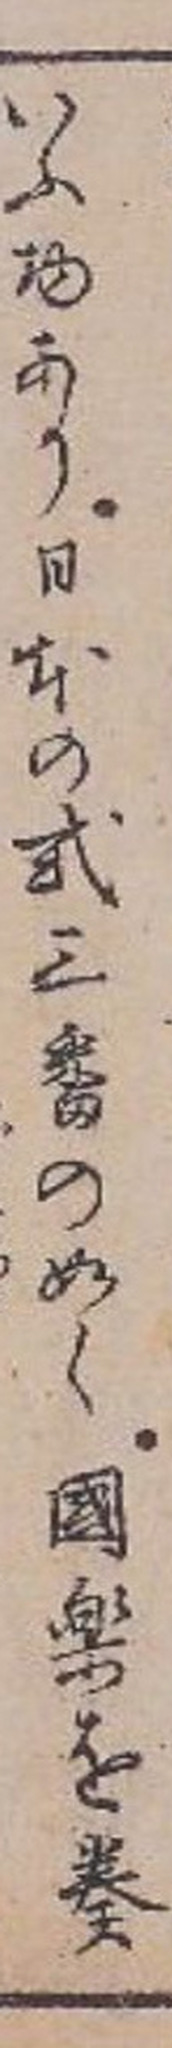いふ物あり、日本の式三番の如く、国楽を奏
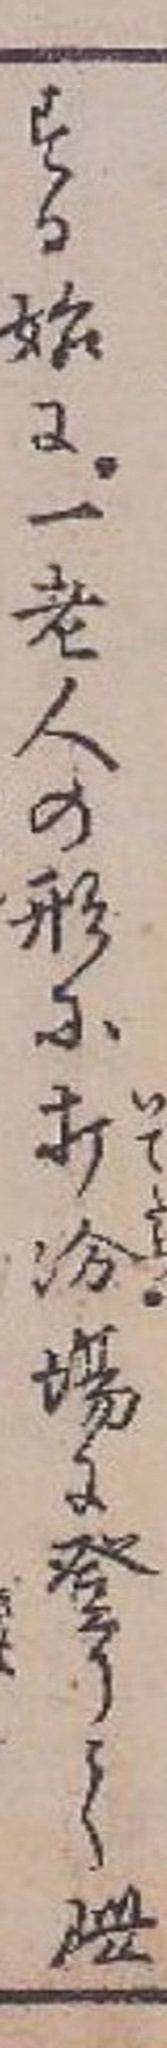する始に、一老人の形に打汾、場に登りて瑞
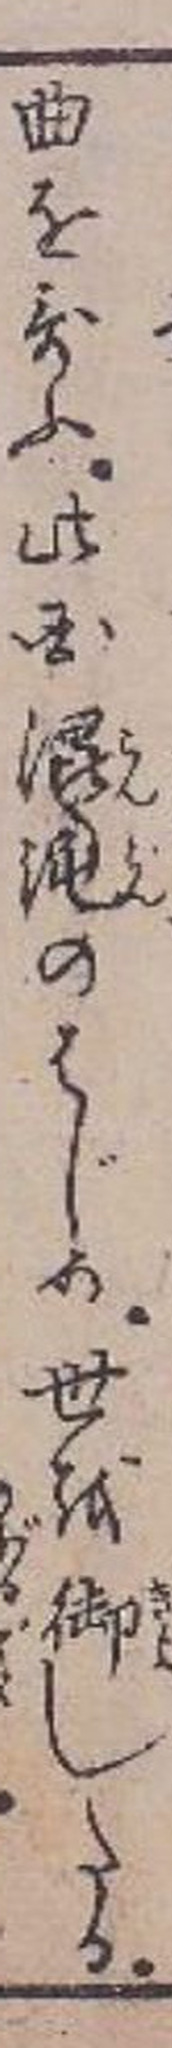曲を歌ふ、此国混沌のはじめ、世を御したる、
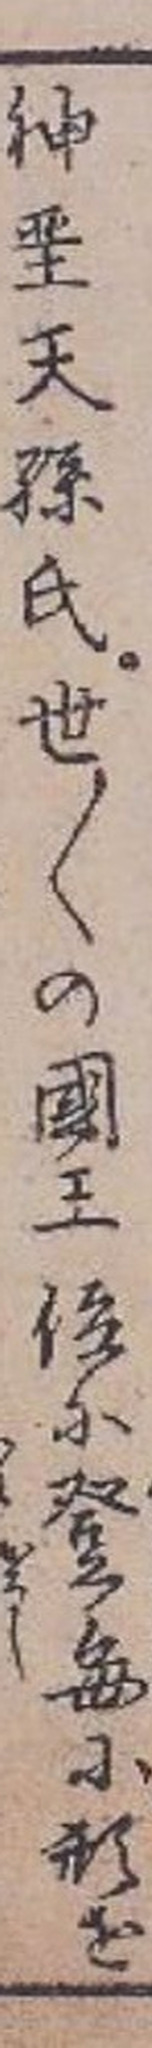神聖天孫氏、世〳〵の国王位に登毎に、形を
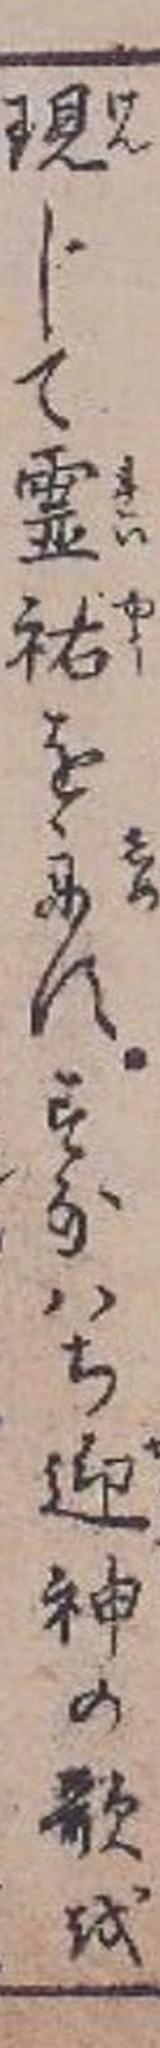現じて霊祐を示す、すなはち迎神の歌を
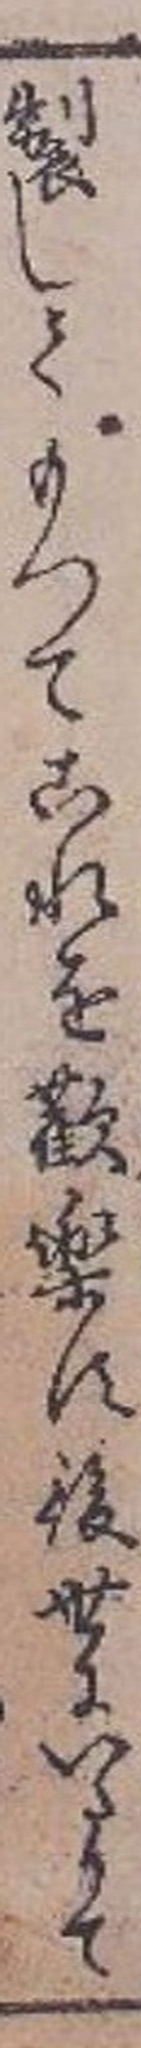製して、もつてこれを歓楽す、後世にいたりて、
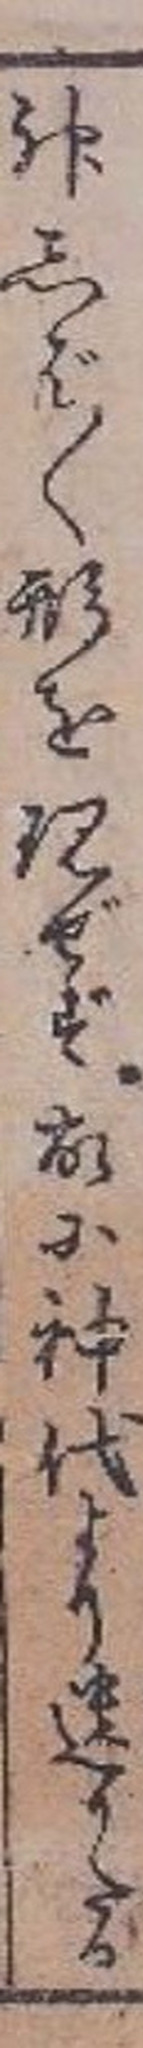神しば〳〵形を現ぜず、故に神代より遺りたる

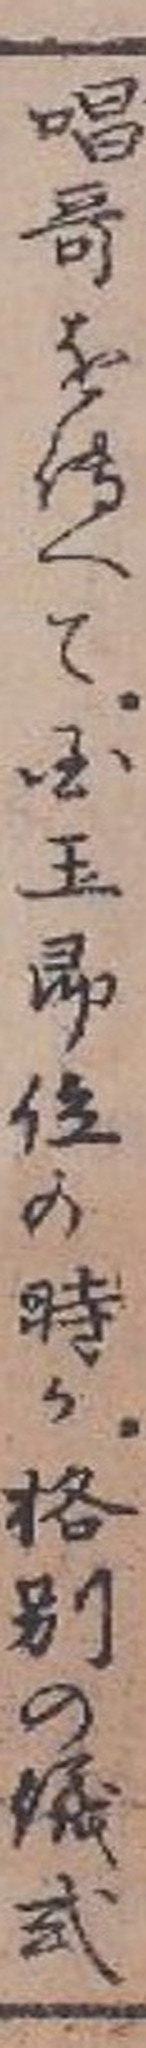唱歌を伝へて、国王即位の時か、格別の儀式
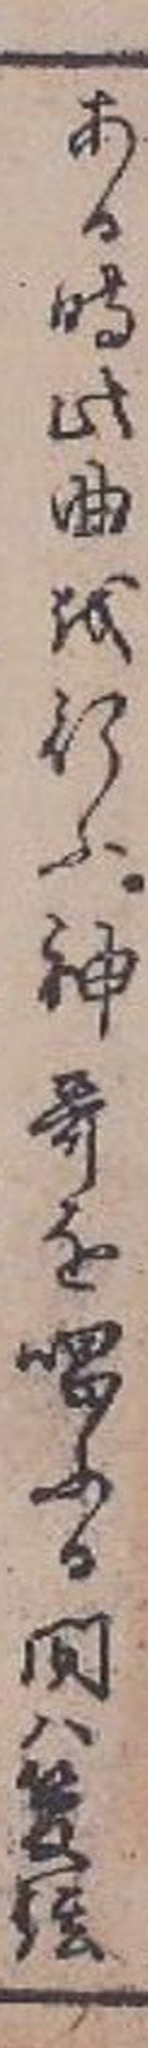ある時此曲を行ふ、神歌を唱ふる間は管弦
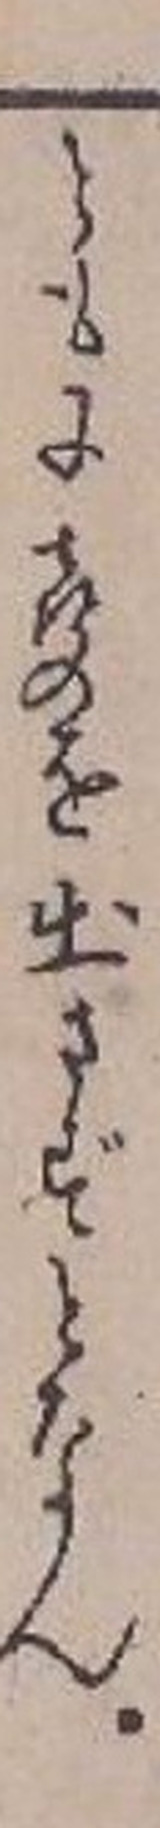ともに声を出さずとなん、
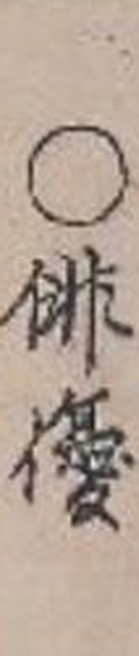〇俳優
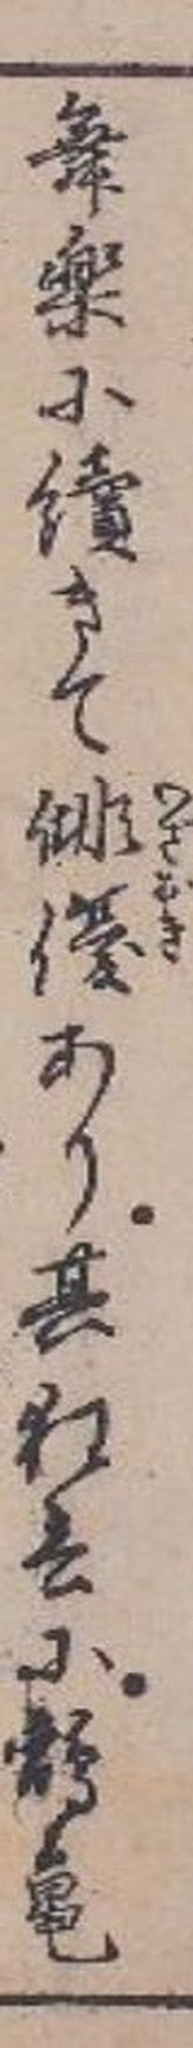舞楽に続きて俳優あり、其狂言に、鶴亀
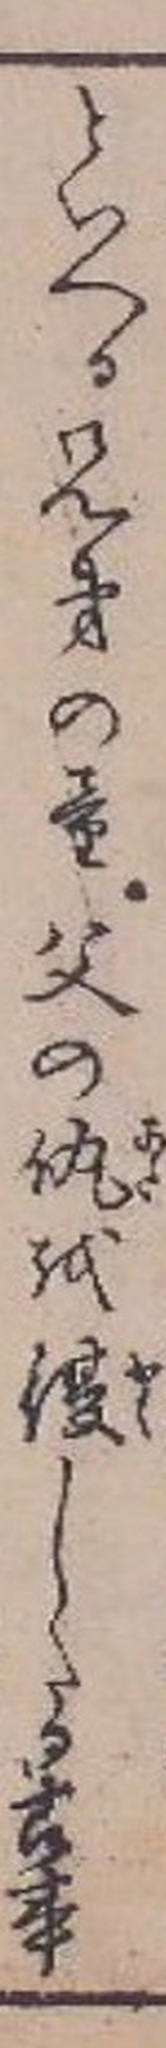といへる兄弟の童、父の仇を復したる古事
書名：琉球談
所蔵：University of the Ryukyus Library
